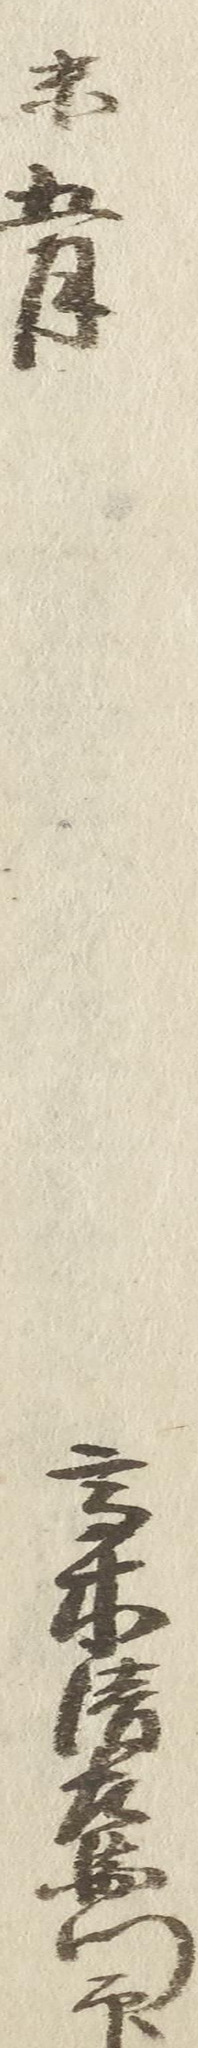未五月髙木清左衛門

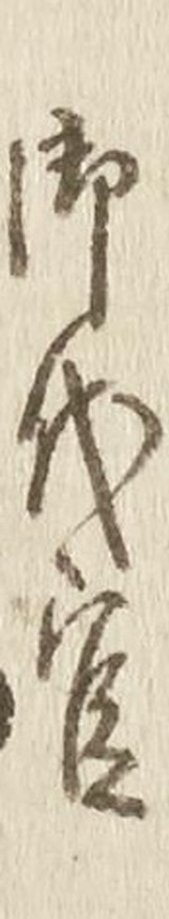御代官
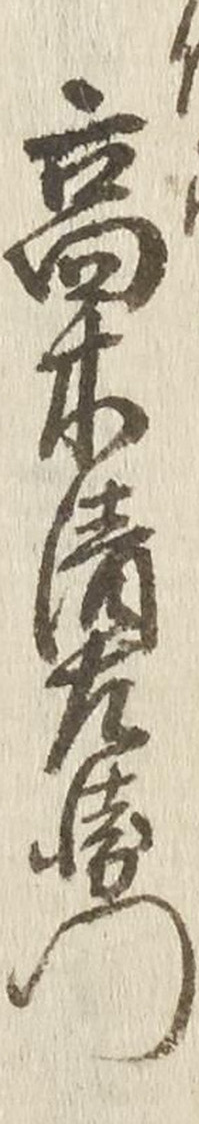髙木清左衛門
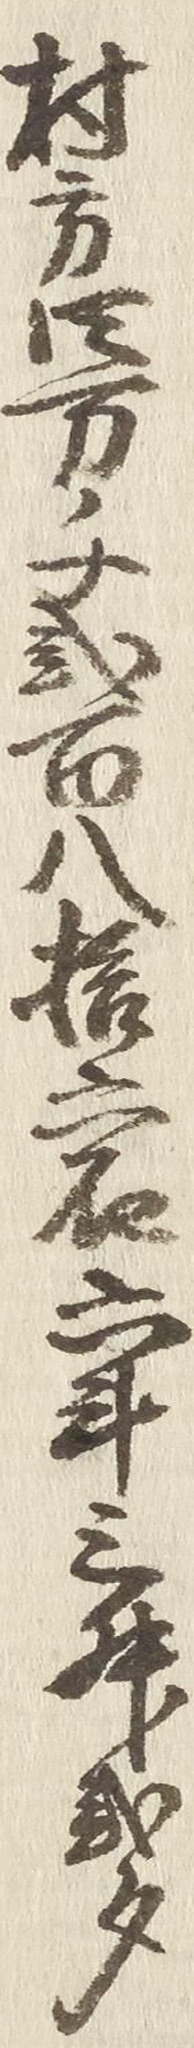村方四万千弐百八拾六石六斗三升弐勺
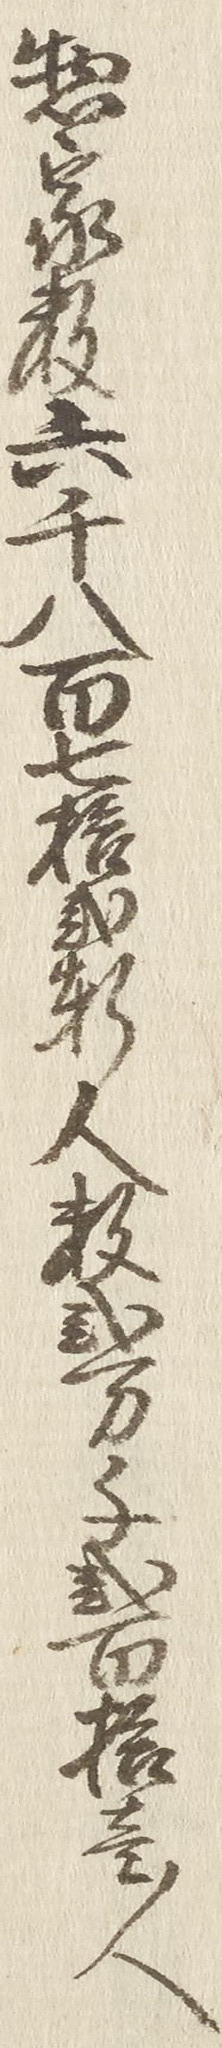惣家数六千八百七拾弐軒人数弐万千弐百拾壱人
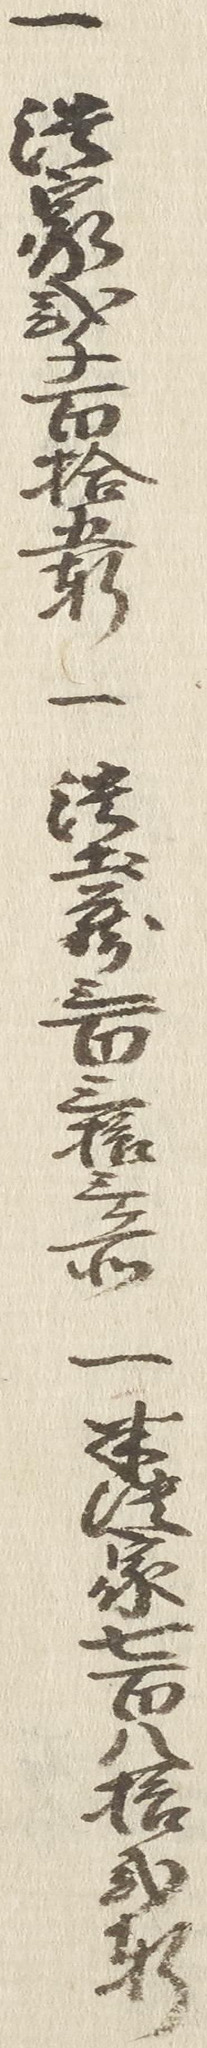一潰家弐千百拾五軒一潰土蔵三百三拾三ヶ所一半潰家七百八拾弐軒
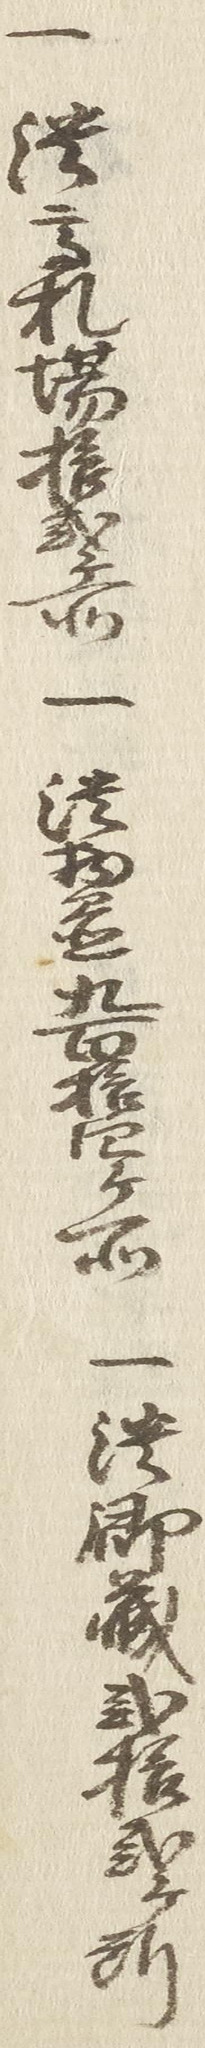一潰高札場拾弐ヶ所一潰物置九百拾四ヶ所一潰郷蔵弐拾弐ヶ所
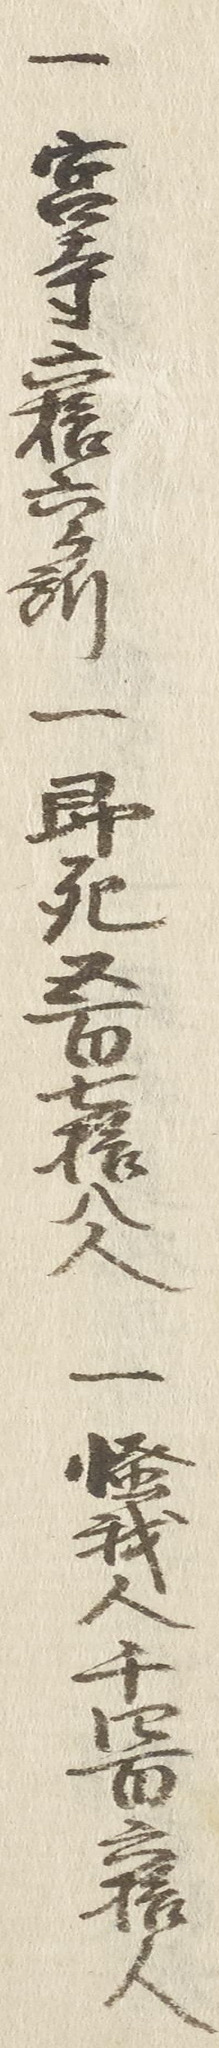一宮寺六拾六ヶ所一即死五百七拾八人一怪我人千四百六拾人
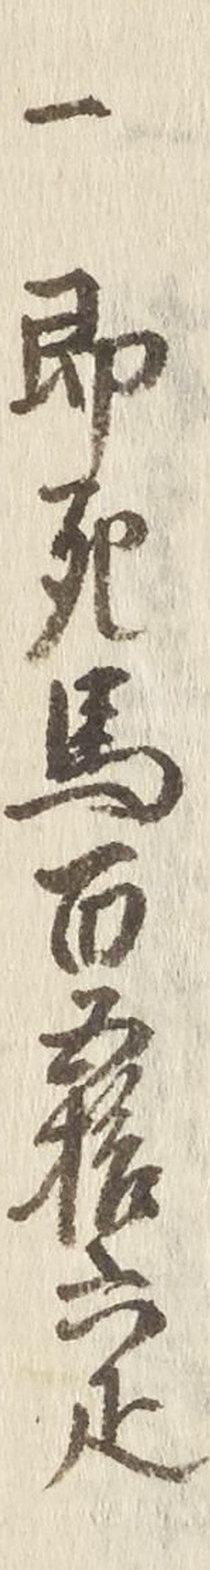一即死馬百五拾六疋
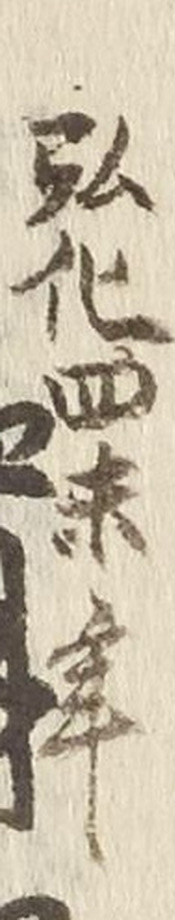弘化四未年
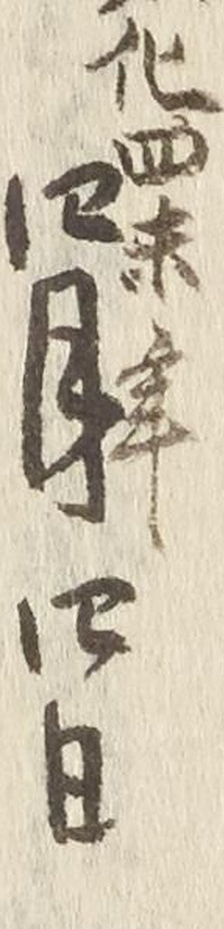四月四日
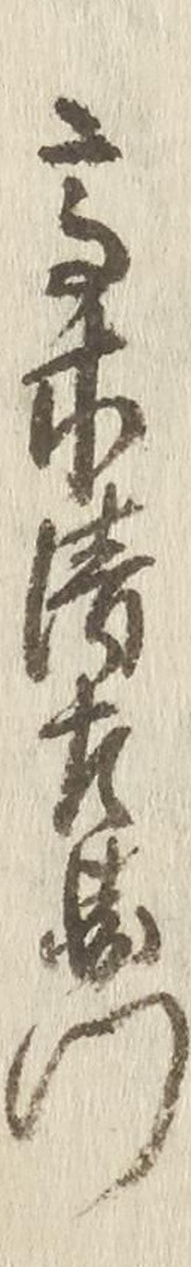髙木清左衛門
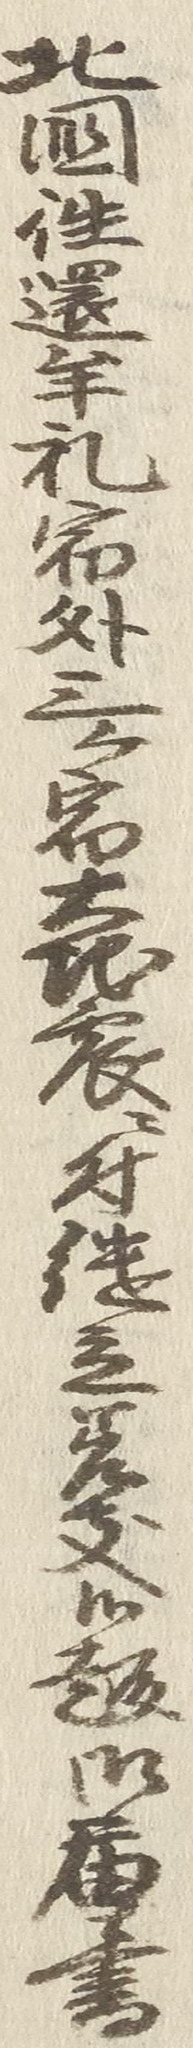北国往還牟礼宿外三ヶ宿大地震ニ付継立差支候趣御届書

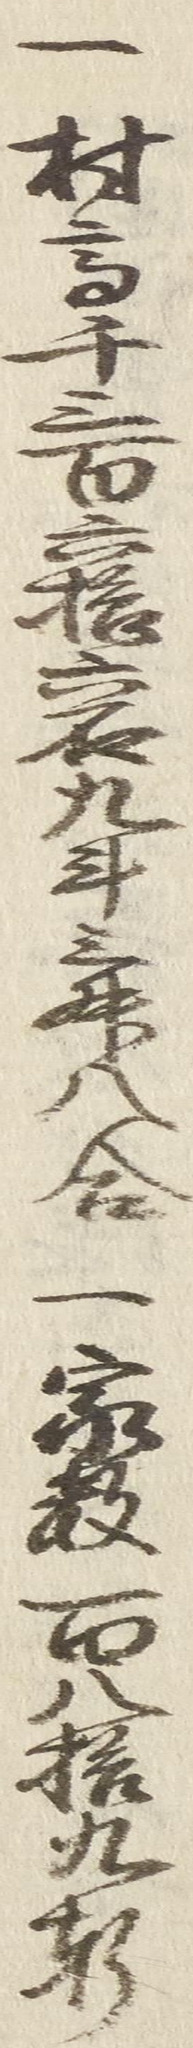一村高千三百六拾六石九斗三升八合一家数百八拾九軒
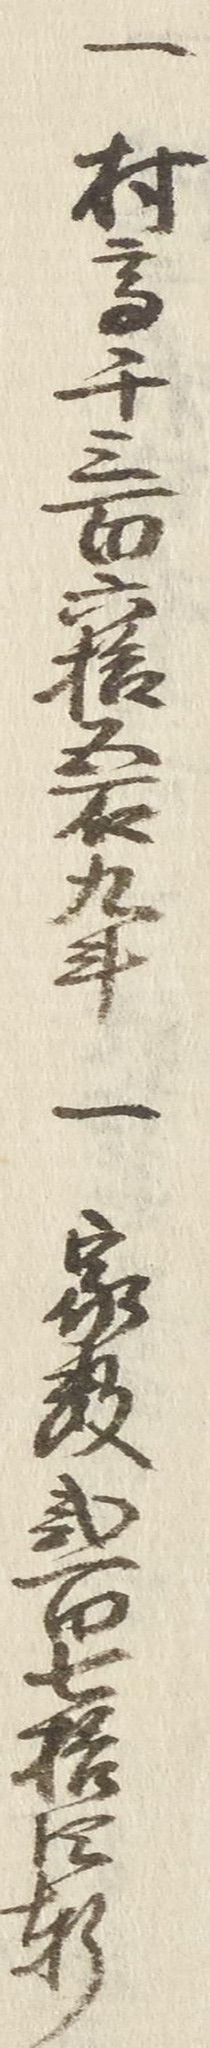一村高千三百六拾五石九斗一家数弐百七拾四軒
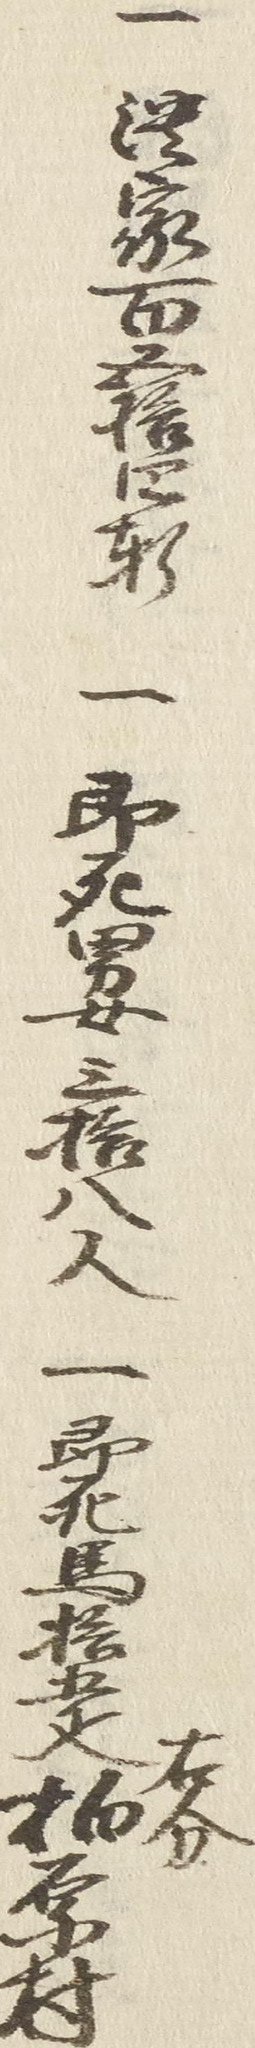一潰家百五拾四軒〉一即死男女三拾八人一即死馬拾五疋右分柏原村
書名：従往古地震御届書記誌之一
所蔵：東京大学地震研究所図書室 Earthquake Research Institute Library, The University of Tokyo, JAPAN
